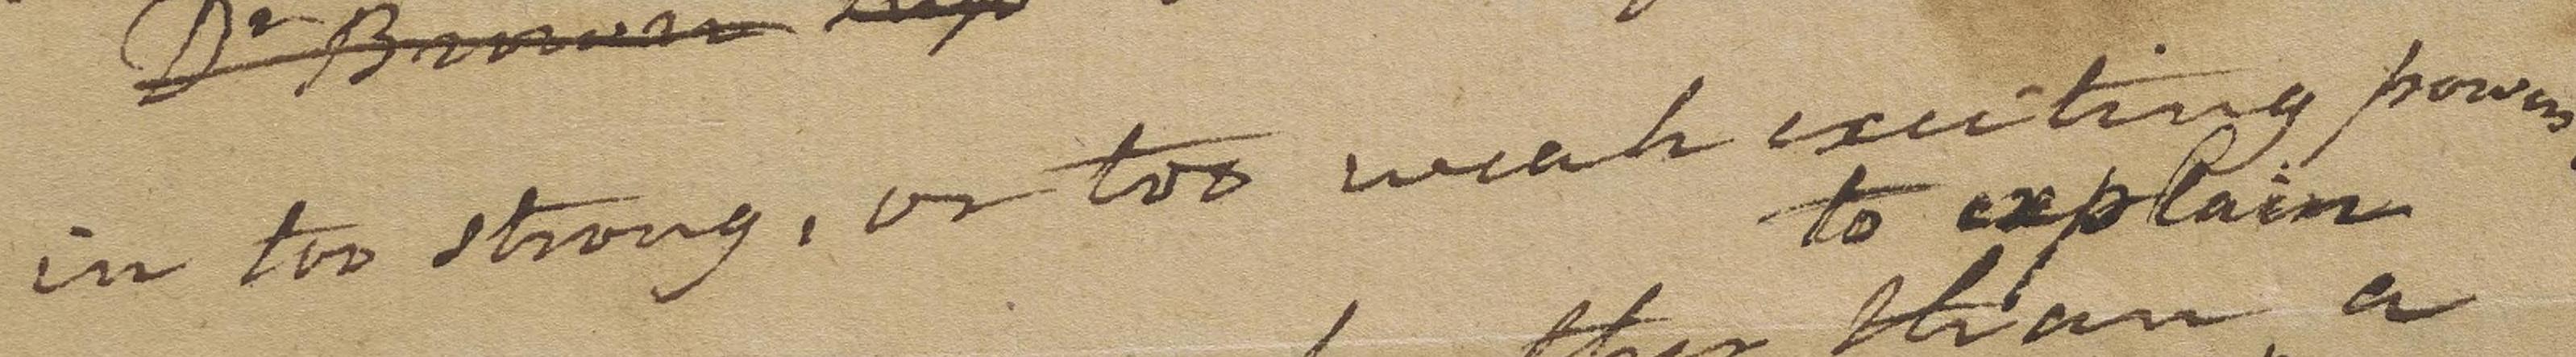in too strong, or too weak exciting powers
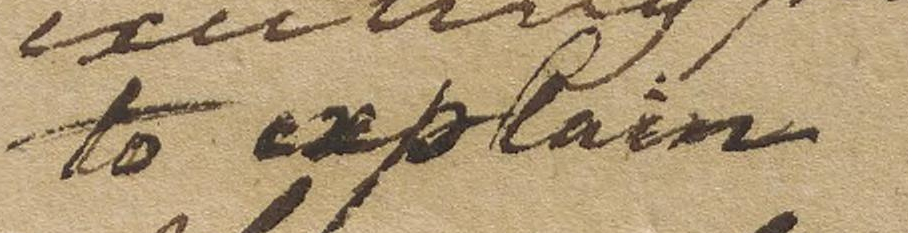to explain
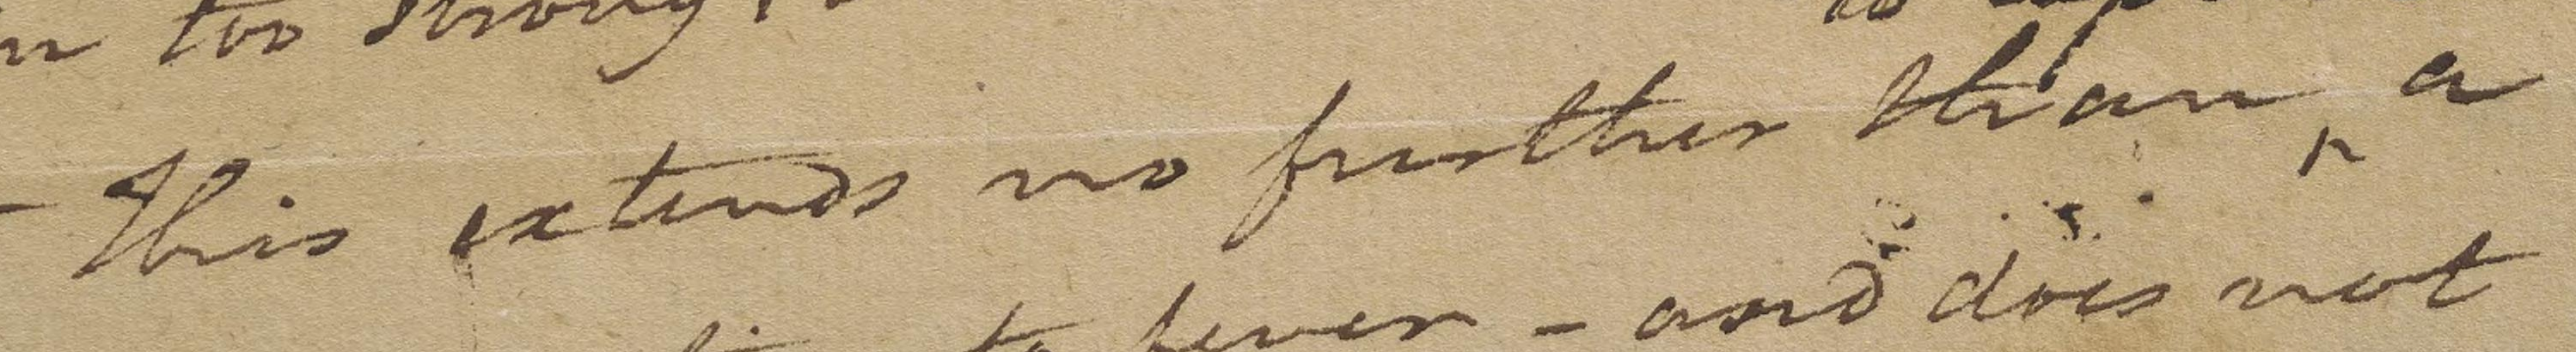This extends no further than ^ a
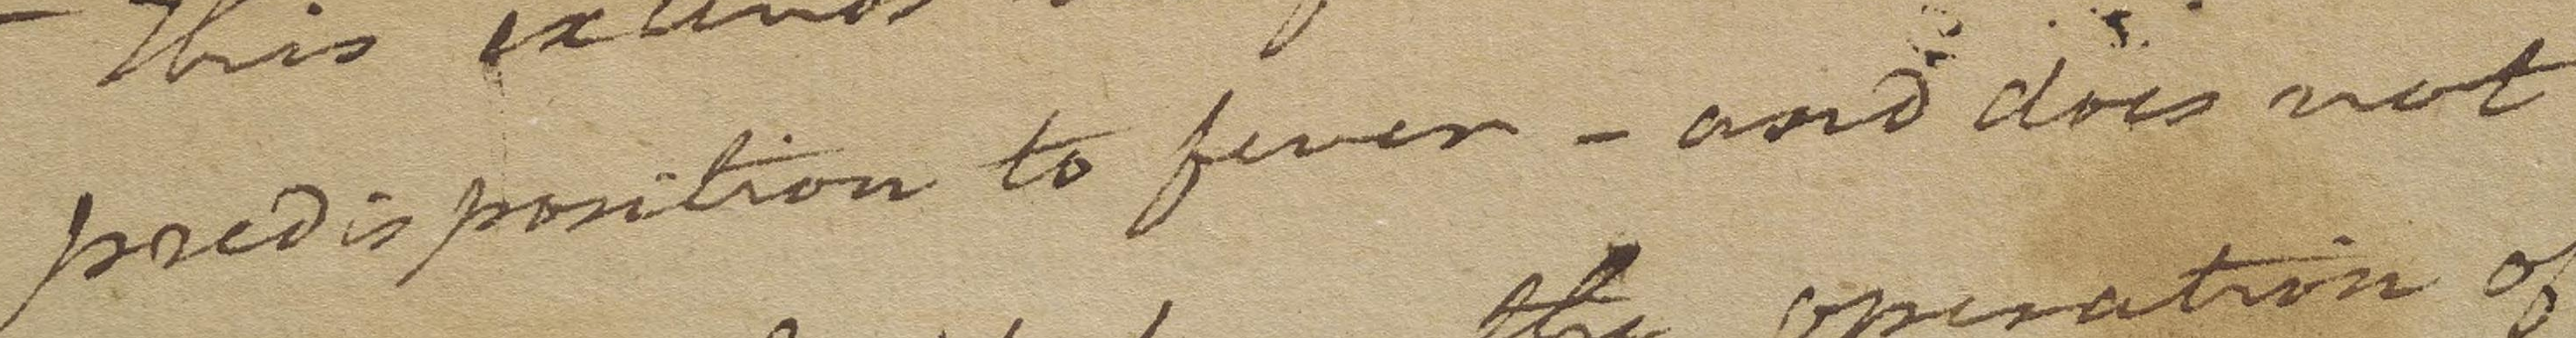predisposition to fever, and does not
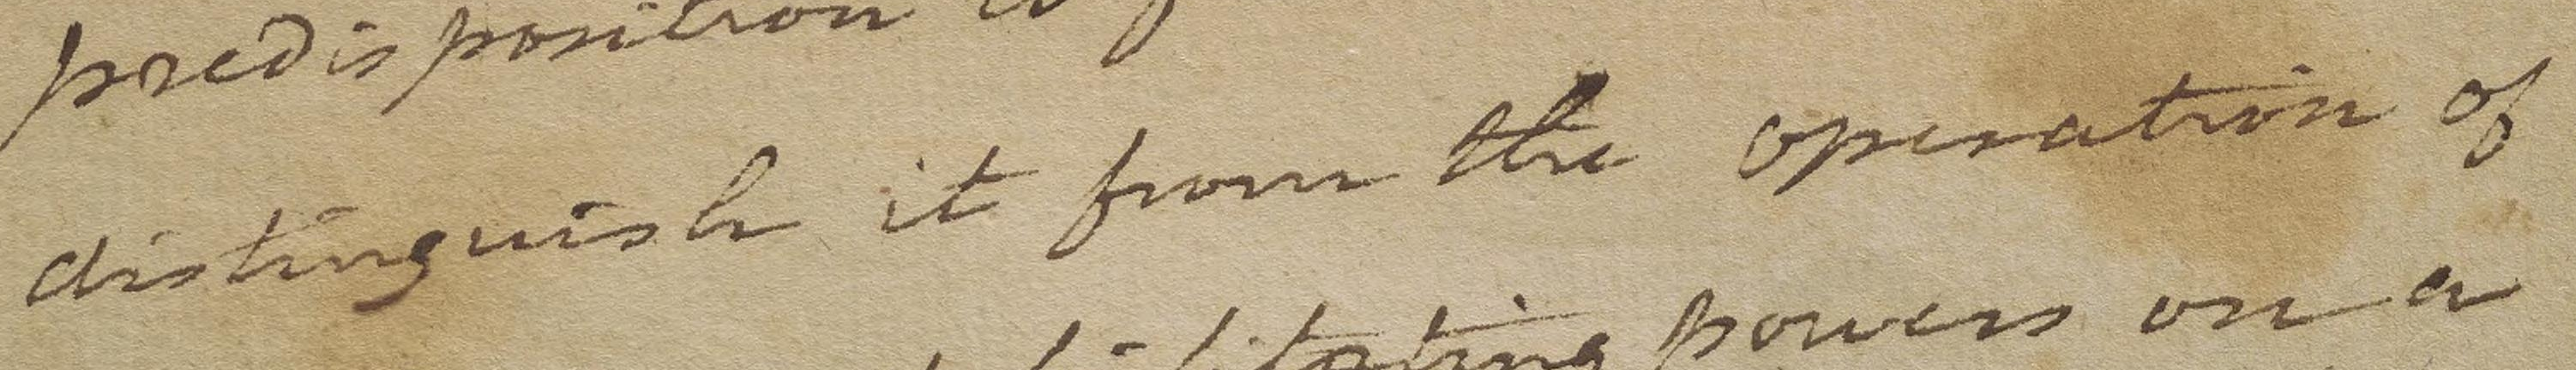distinguish it from the operation of
